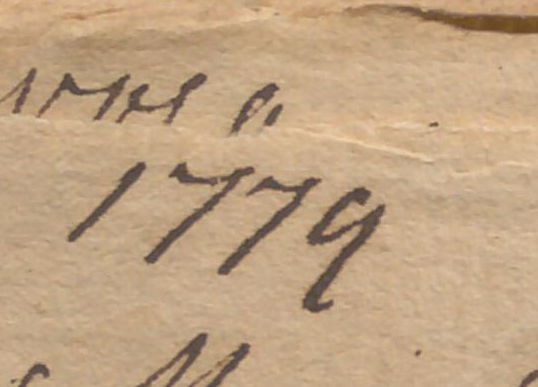1779
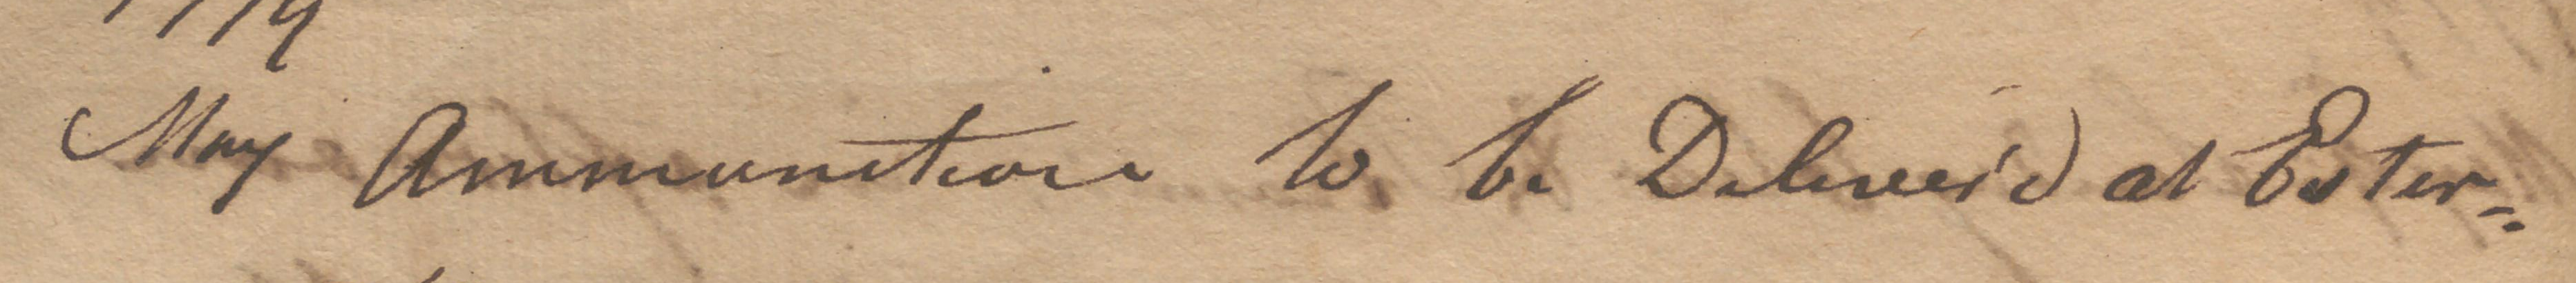May Ammunition to be Deliver'd at Ester-
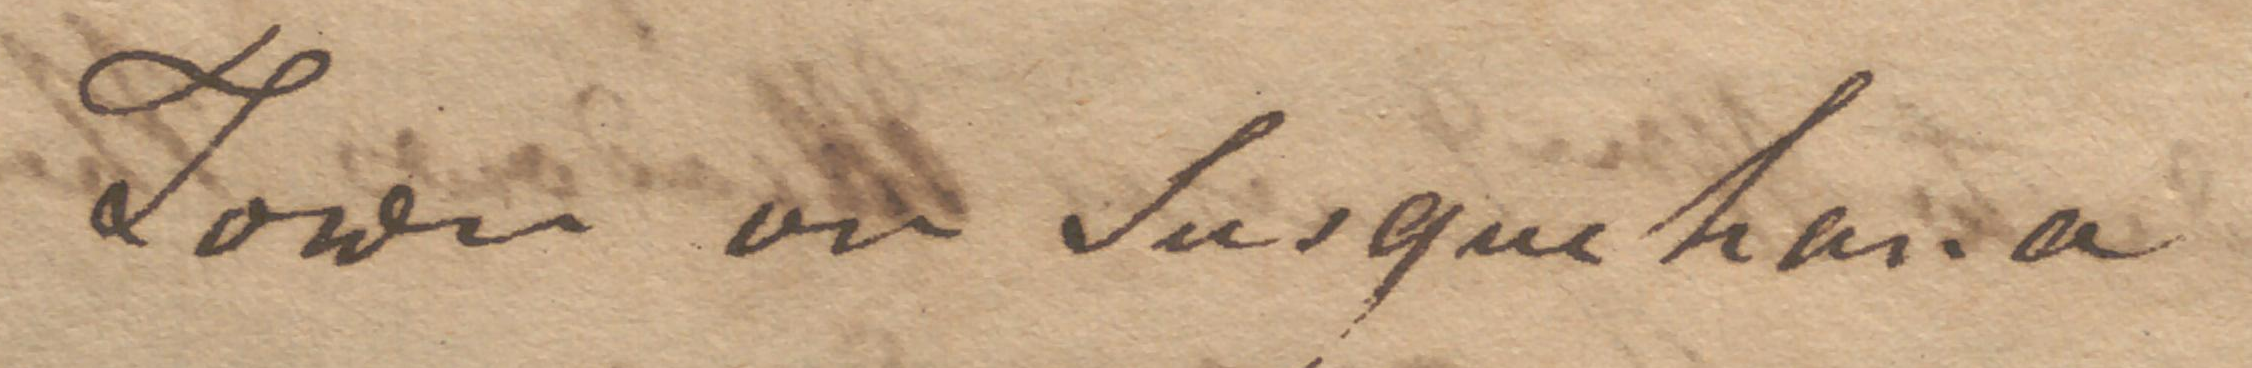Town on Susquehana
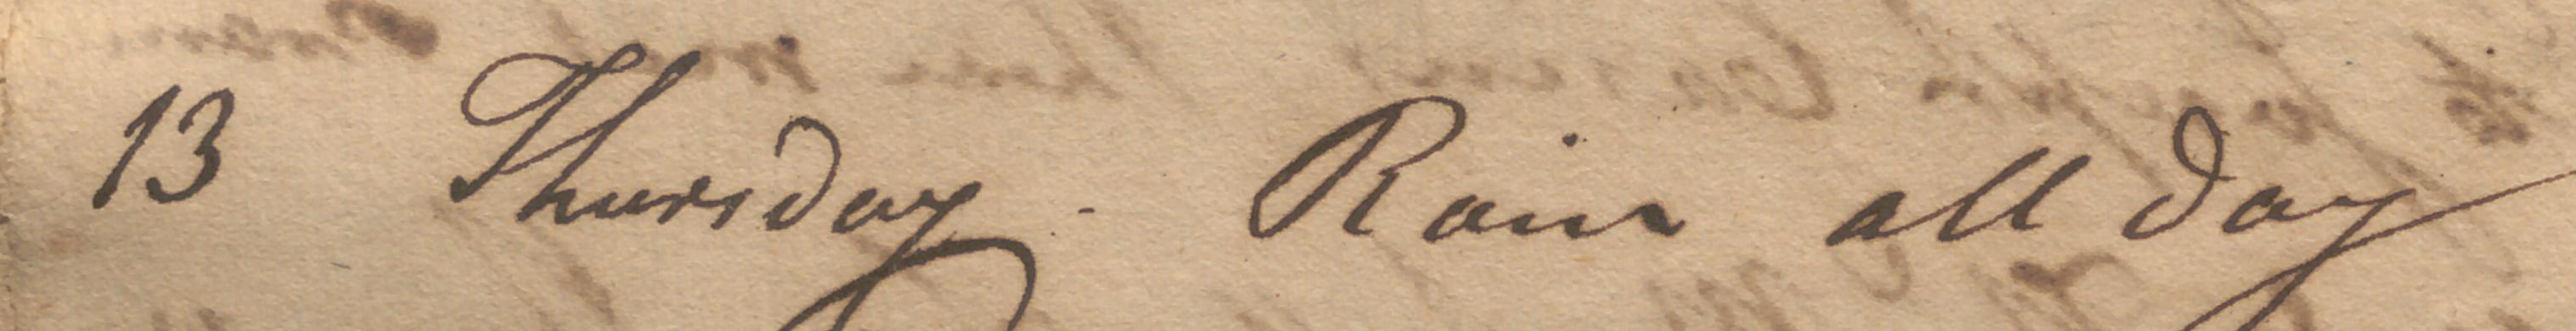13 Thursday. Rain all day
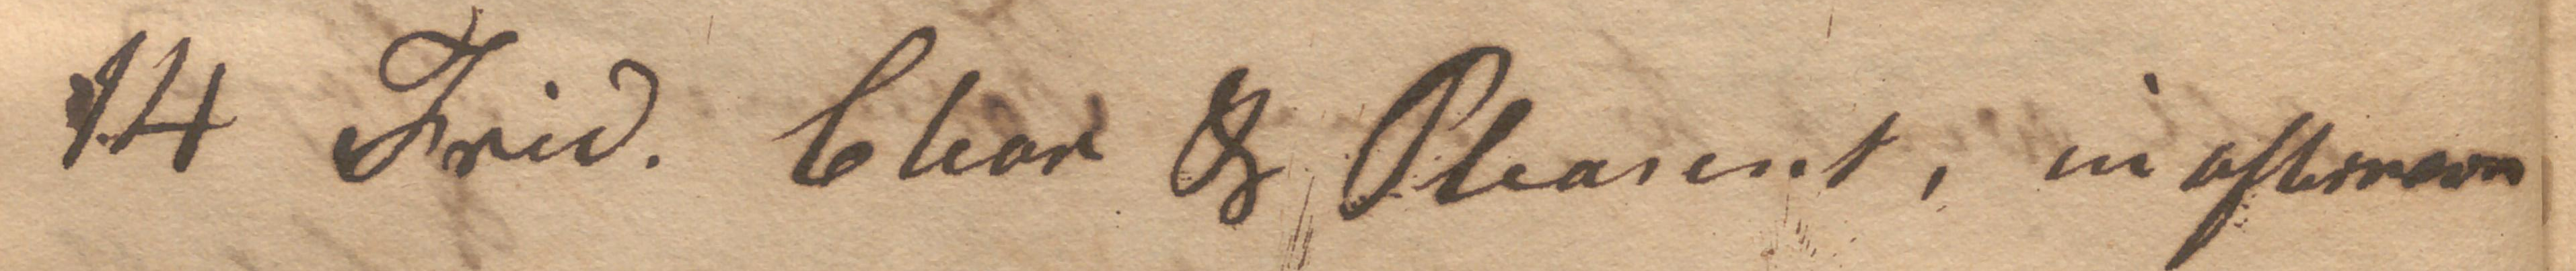14 Frid. Clear & Pleasent, in afternoon
